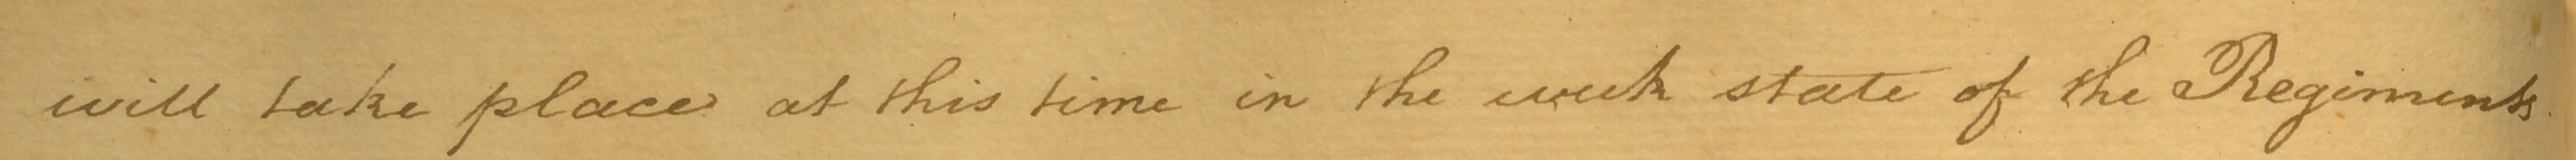will take place at this time in the week state of the Regiments.
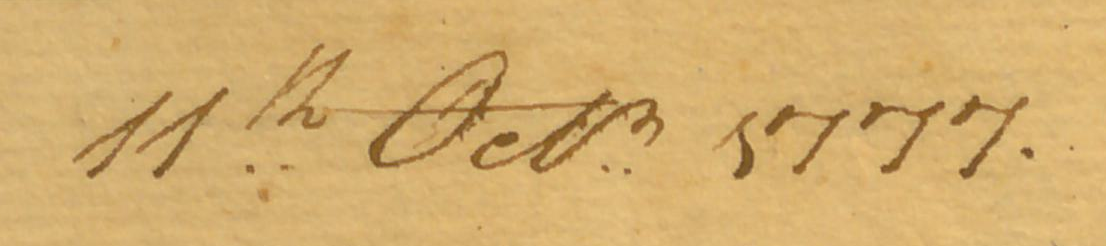11^th. Oct^r. 1777.
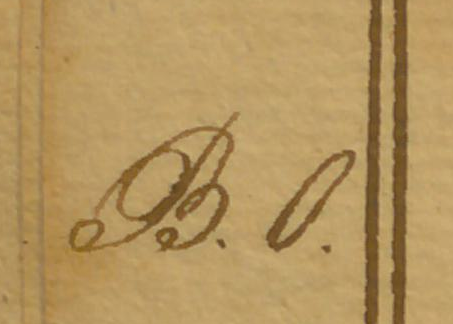B.O.
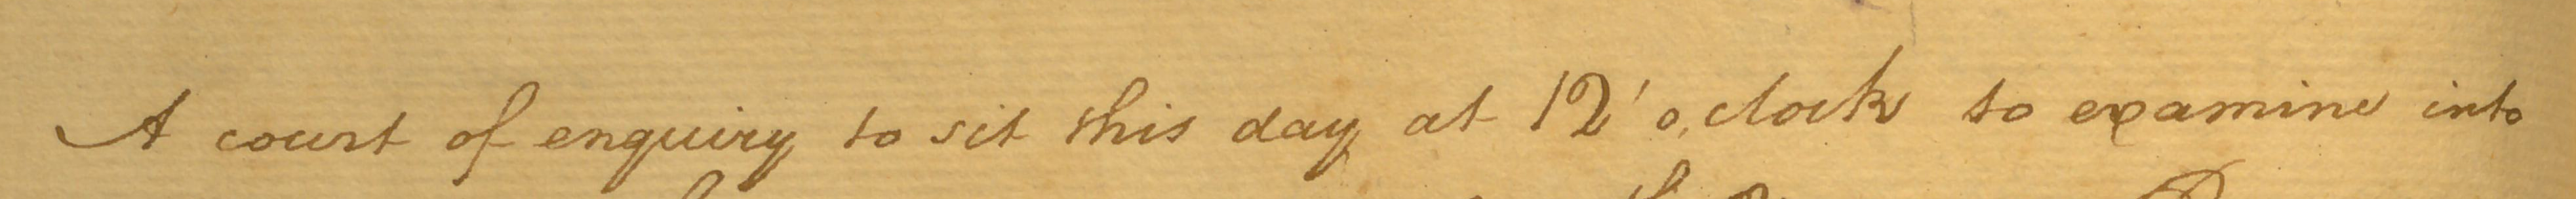A court of enquiry to sit this day at 12 oclock to examine into
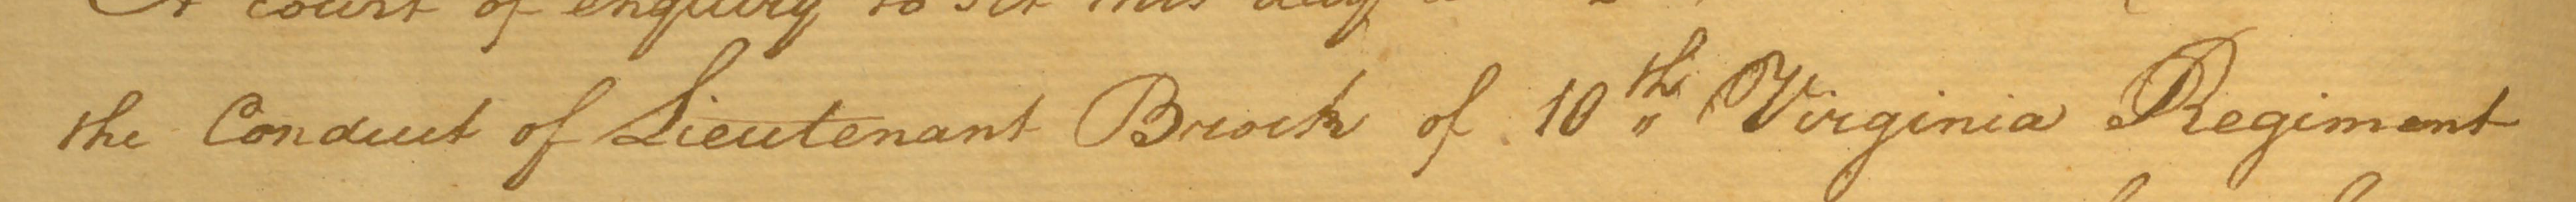the Conduct of Lieutenant Brock of 10^th. Virginia Regiment
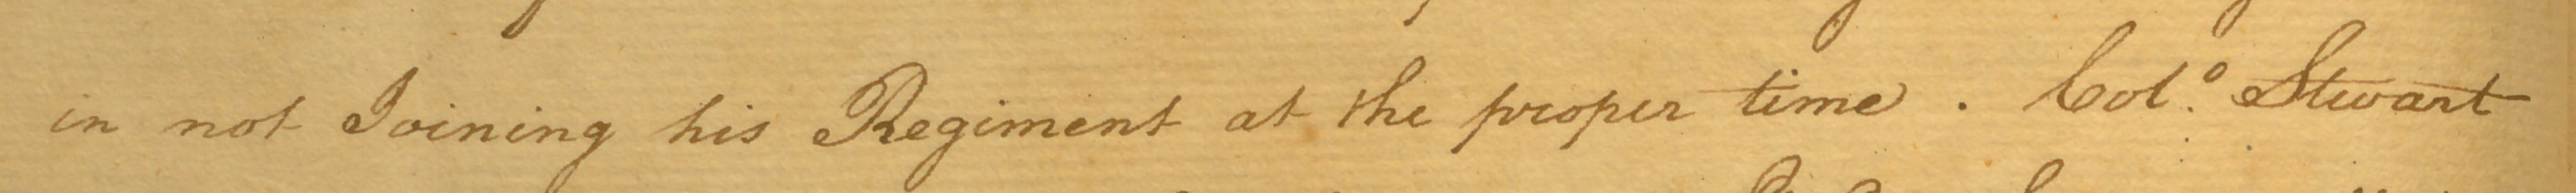in not Joining his Regiment at the proper time. Col^o. Stewart
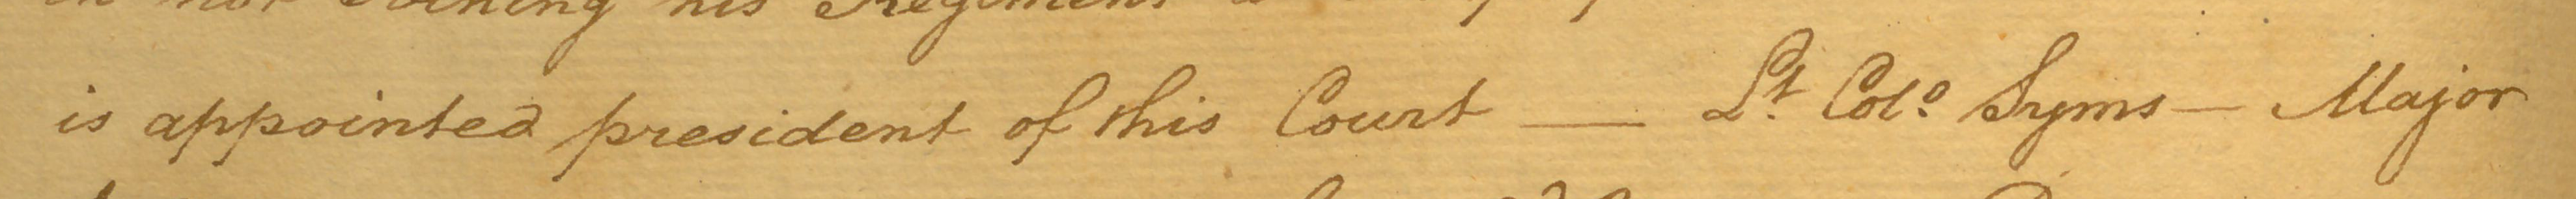is appointed president of this Court- L^t. Col^o. Syms- Major
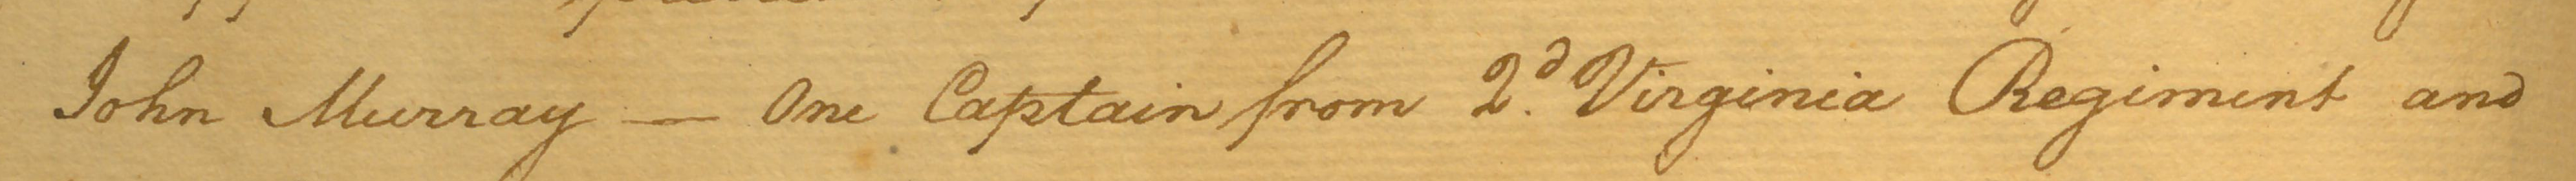John Murray- One Captain from 2^d. Virginia Regiment and
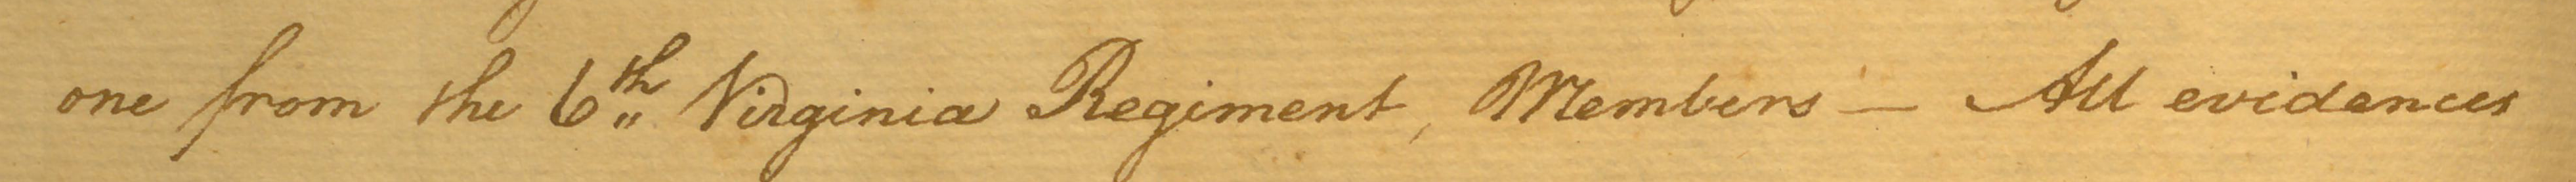one from the 6^th. Virginia Regiment, Members- All evidences
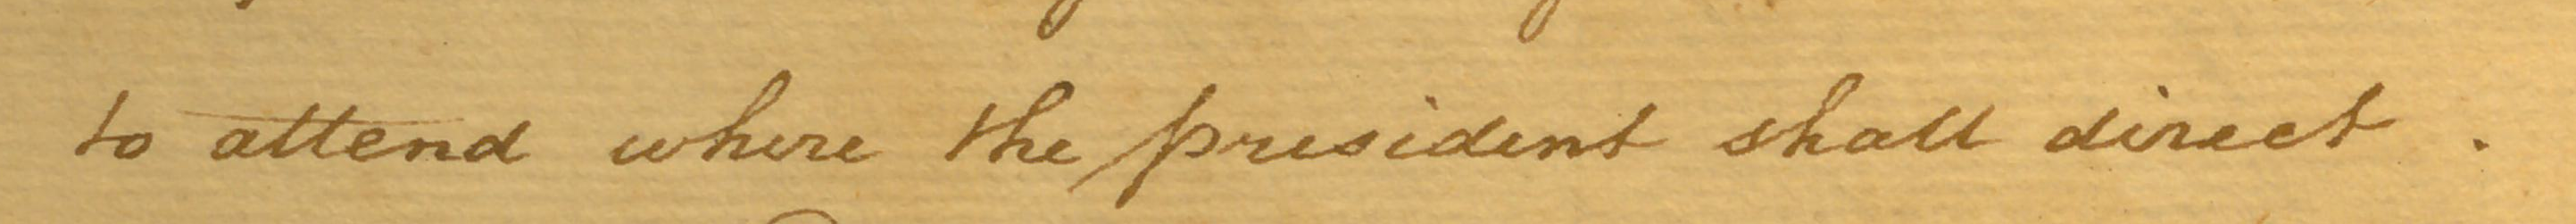to attend where the president shall direct.
